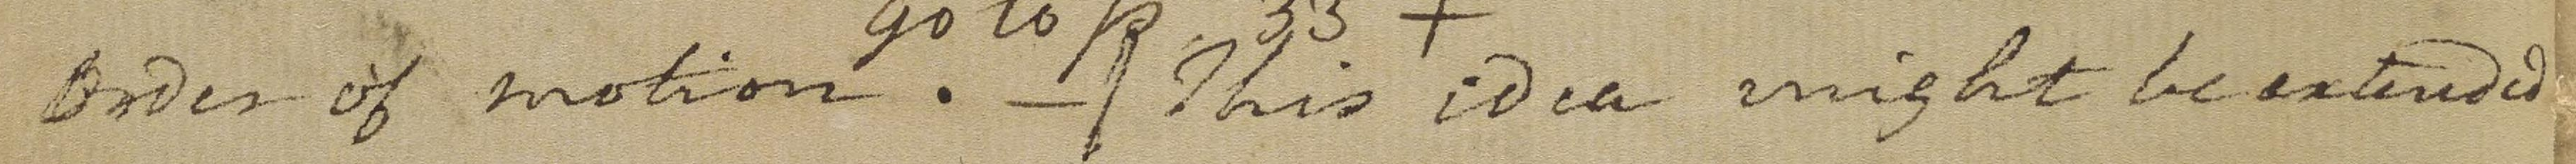order of motion.- This idea might be extended
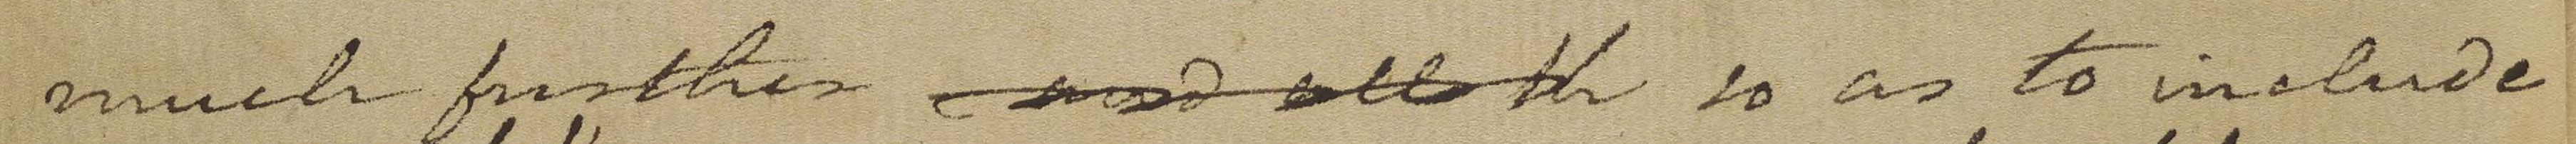much further [and all th] so as to include
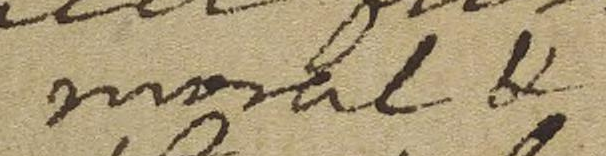moral &
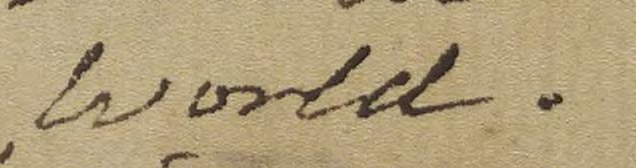world.
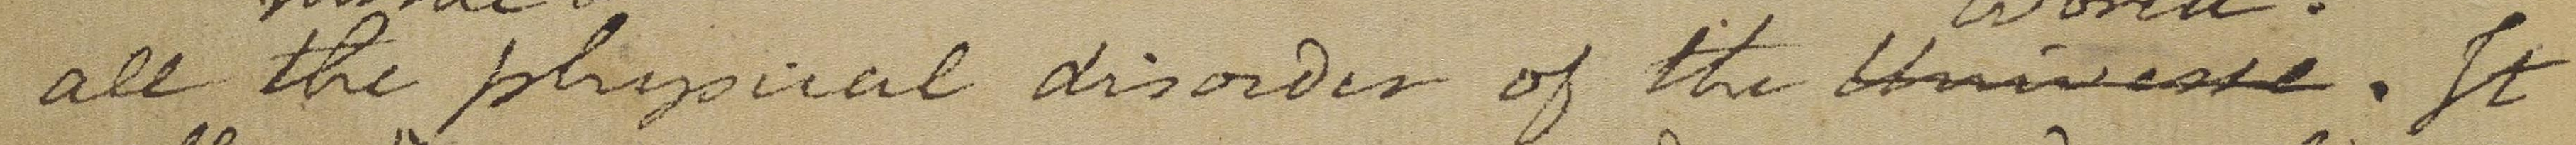all the ^ physical disorder of the [Universe]. It
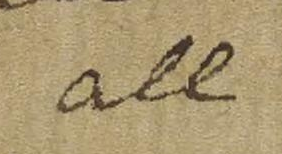all
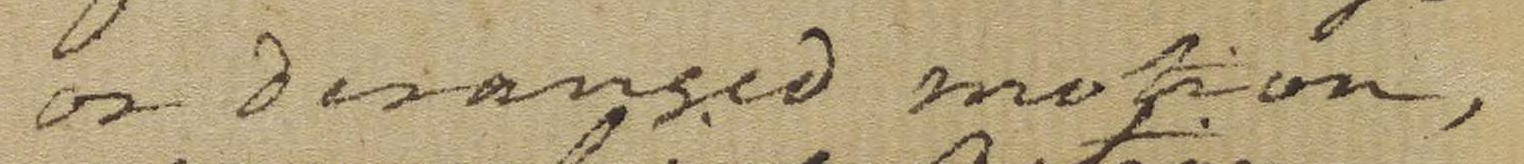or deranged motion,
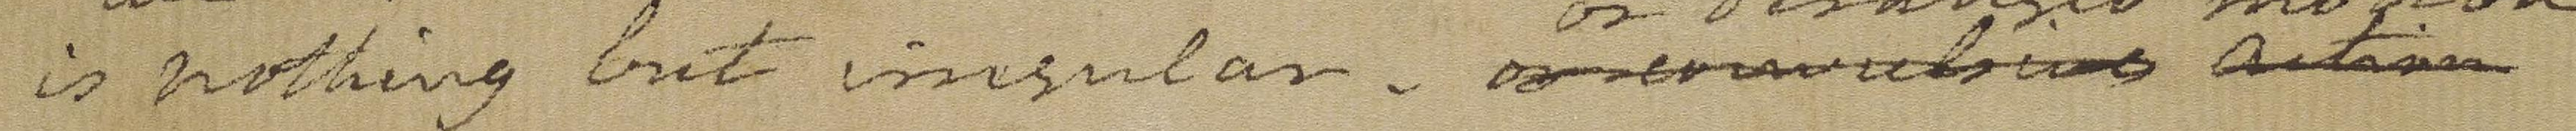is nothing but irregular, [or convulsive] [action]
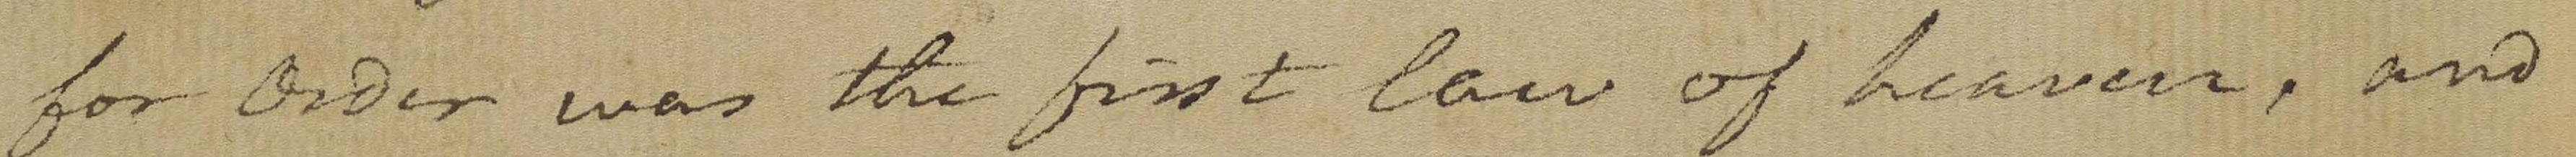for Order was the first law of heaven, and
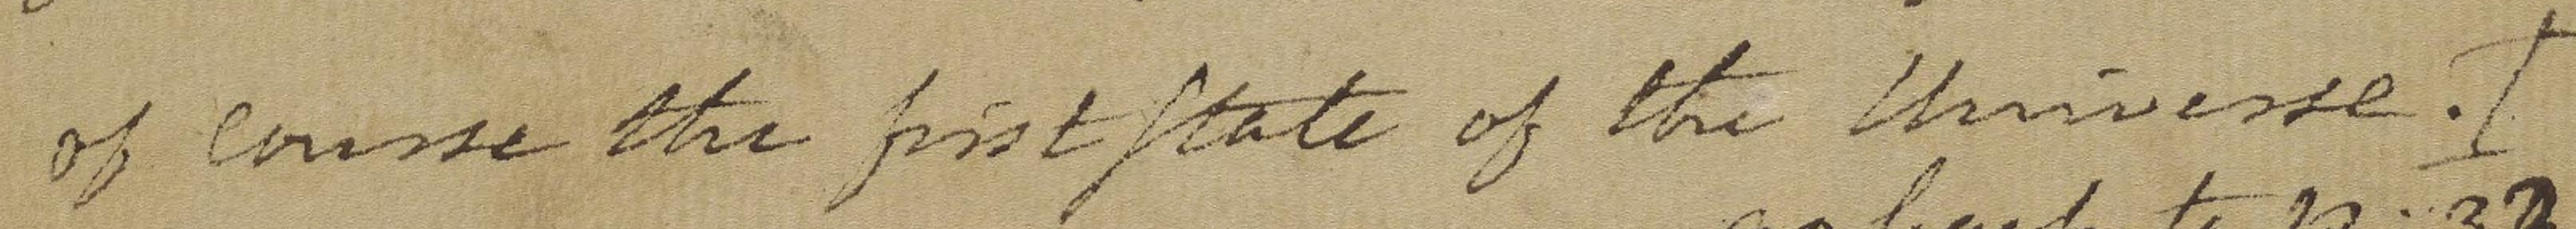of course the first state of the universe.)
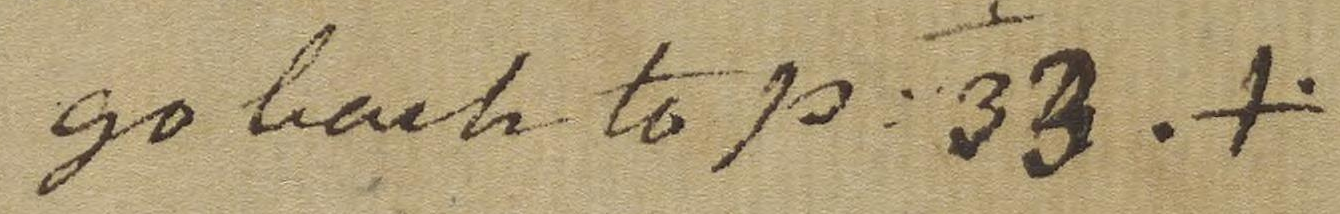go back to p. 33+
